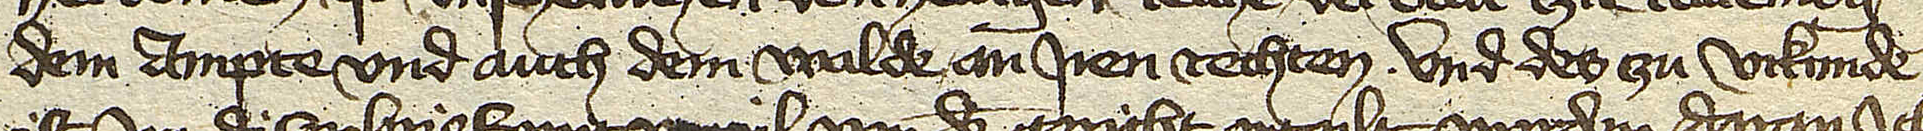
dem Ampte vnd auch dem walde an Iren rechten . vnd des cʒu vrkunde
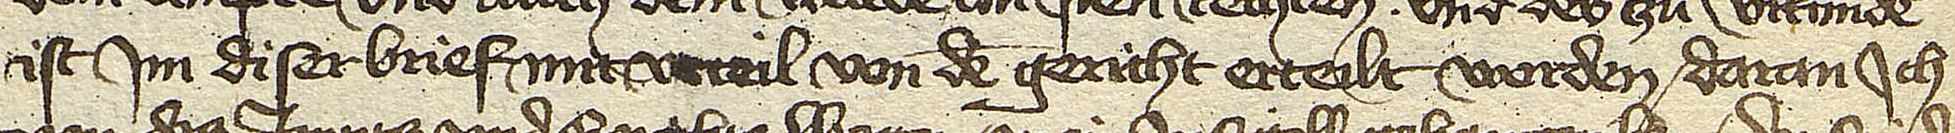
iſt Im diſer brief mit vrteil von de* gericht erteilt worden / daran Ich
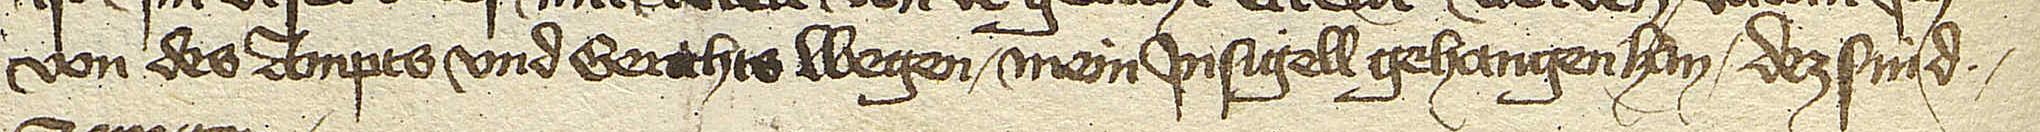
von des Ampts vnd Gerichts wegen / mein Inſigell gehangen han / deʒ ſind . /
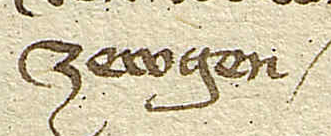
cʒewgen /
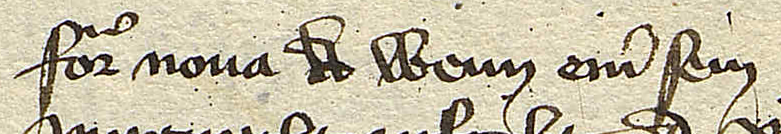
for* noua A wenn ein* ſein
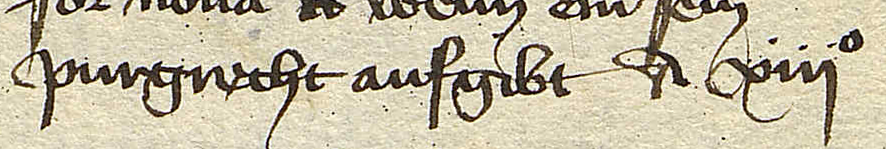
purgrecht aufgibt A xiii*
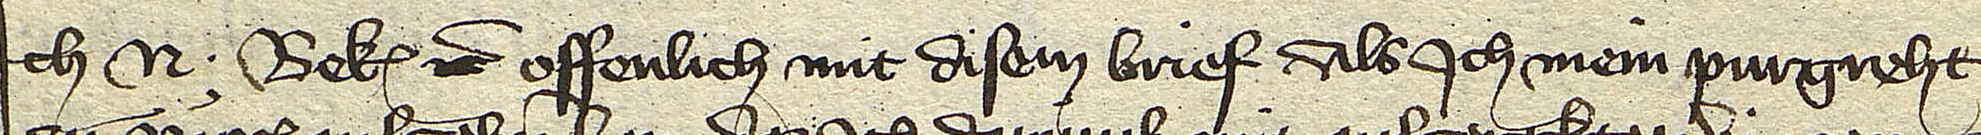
Ich N . Bek* ec* offenlich mit diſem brief / Als Ich mein purgreht
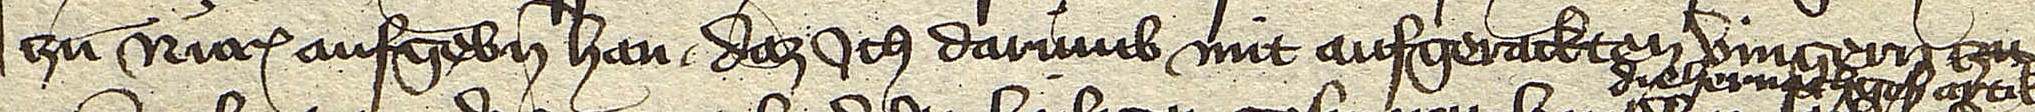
cʒu Nür* aufgebn* han / daʒ Ich darümb mit aufgerackten vingern cʒu
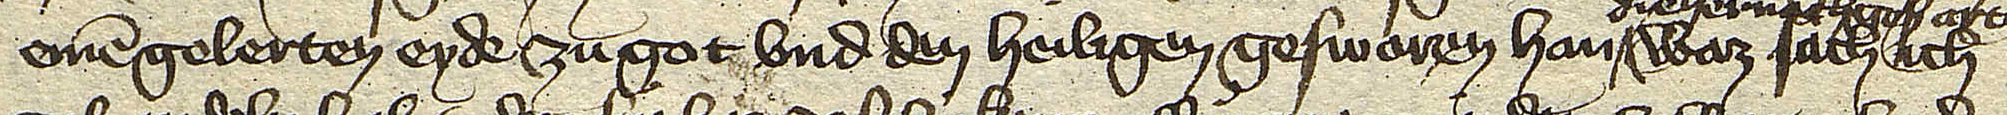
eine* gelerten eyde cʒu got vnd den heiligen geſworen han / waʒ ſach ich
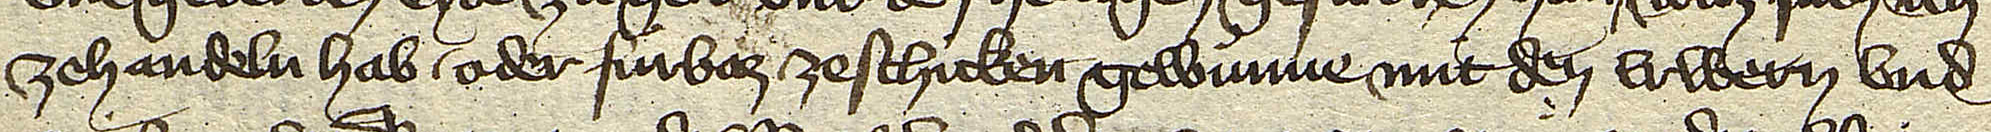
cʒehandeln hab / oder fürbaʒ cʒeſchicken gewünne mit den Erwern vnd
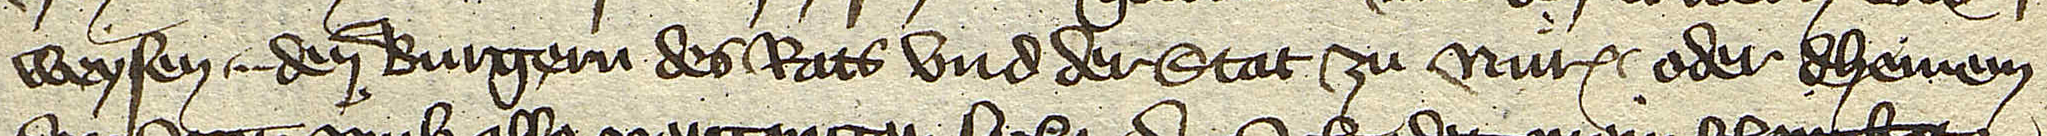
weyſen / ~ den Burgern des Rats vnd der Stat cʒu Nür* / oder dheinen
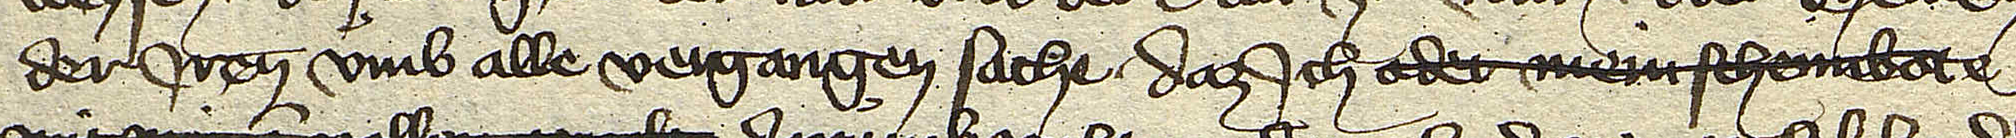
der Iren v̈mb alle vergangen ſache / daʒ Ich oder mein ſcheimbote
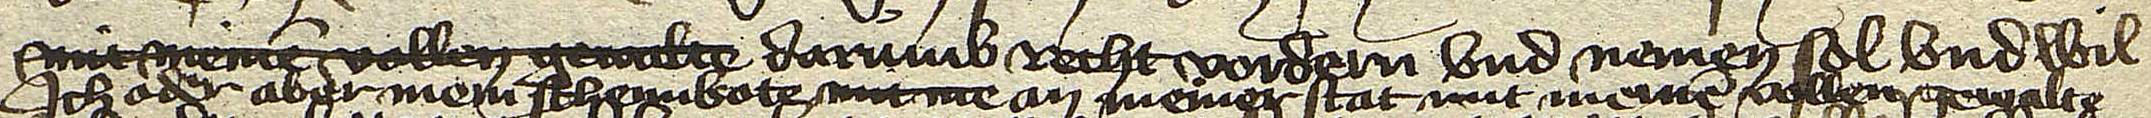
mit meine* vollen gewalte darümb recht vordern vnd nemen ſol vnd wil
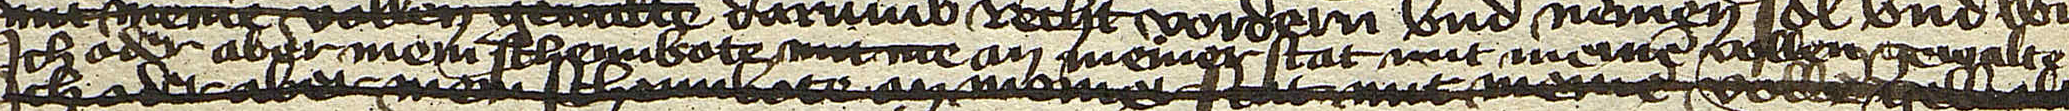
Ich oder aber mein ſcheimbote mit me an meiner ſtat mit meine* vollen gewalte
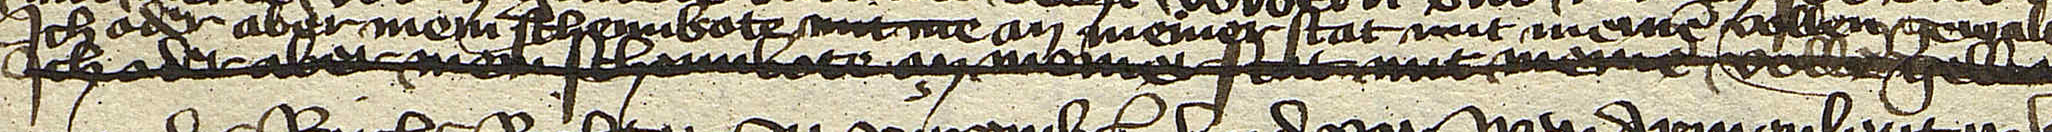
Ich oder aber mein ſcheimbote an meiner ſtat mit meine* volle* gewalt
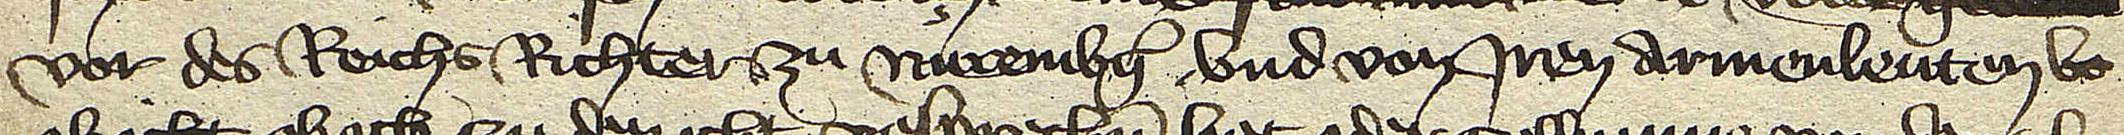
vor des Reichs Richter cʒu Nürembg* / vnd von Iren Armenleuten vo
